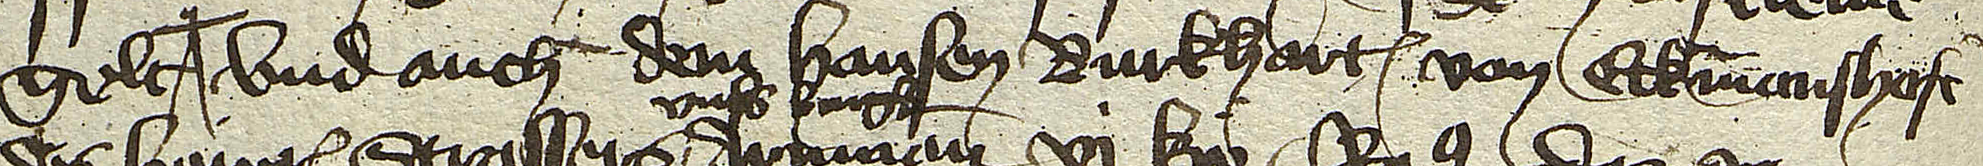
gelt / vnd auch dem hanſen Burkhart* von Eckmanſhofe
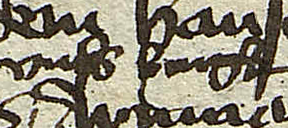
vnſ*s burg*s
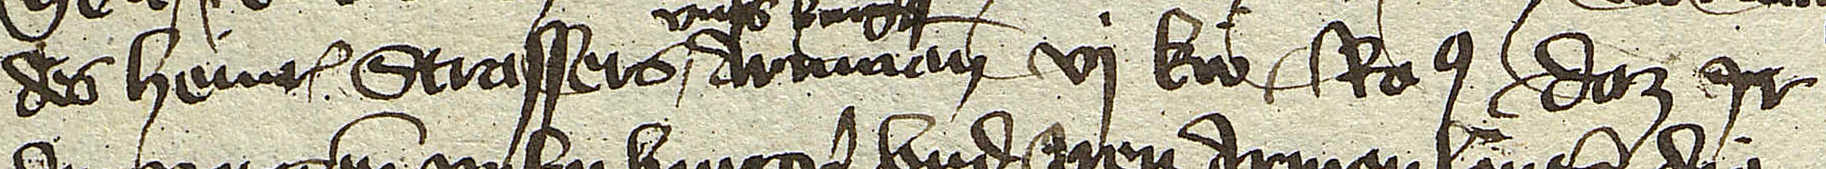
des heinr* Straſſers Armman vi* kw / Ro* / daʒ Ir
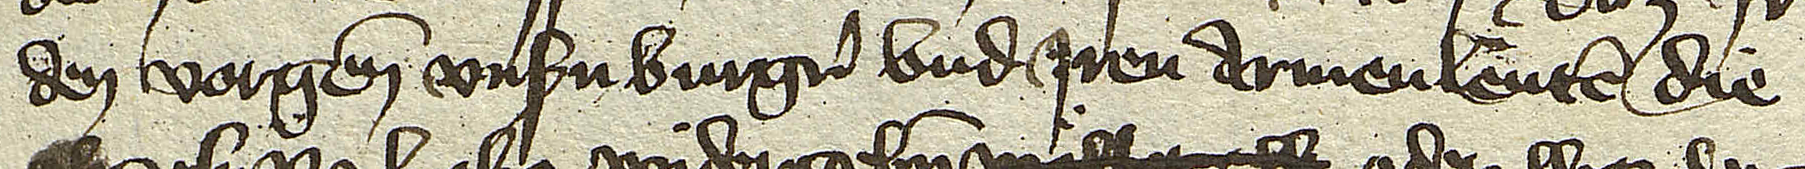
den vorgen* vnſ*n burgn* vnd Iren Armenleute* die
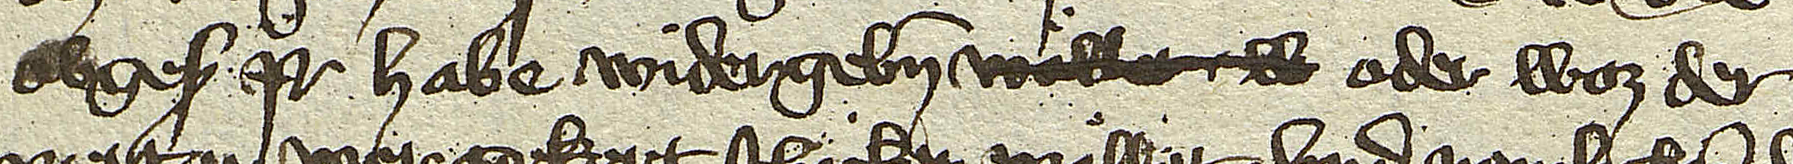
obgeſ* Ir habe widergebn* wöllet / w oder waʒ der
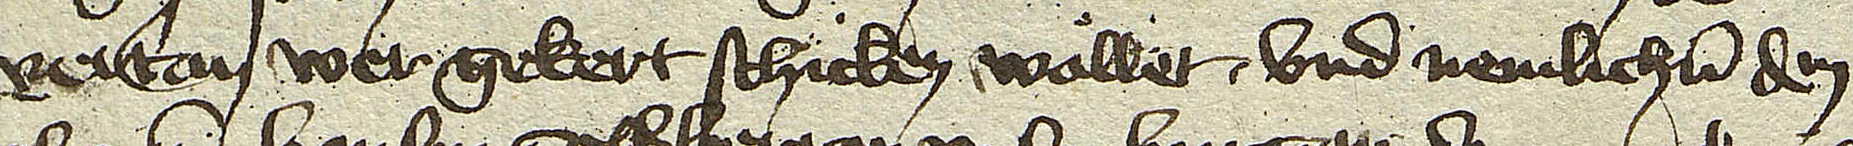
vertan wer gekert ſchicken wöllet / vnd nemlichn* den
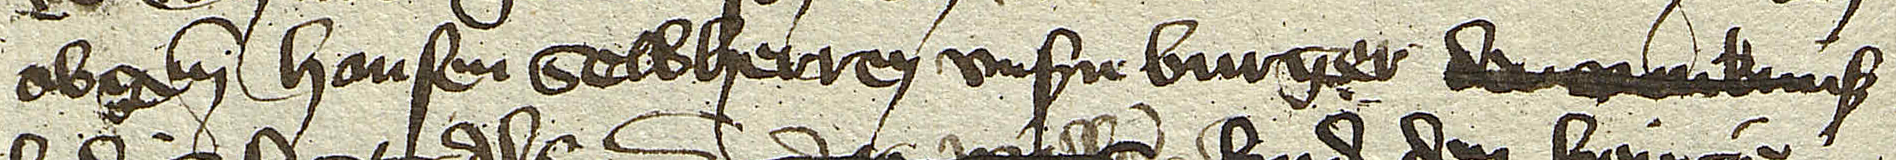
obgen* hanſen Selbherren vnſ*n burger der vanknüſʒ
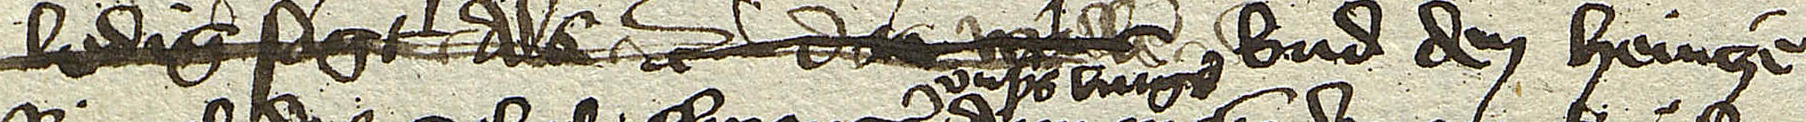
ledig ſagt / Als / ec* das wölle* / vnd den heincʒe
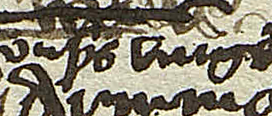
vnſ*s burg*s
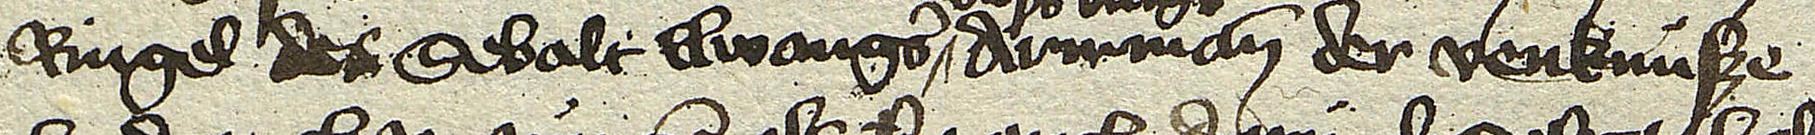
Ringel des Sebolt Elwangs* Armman* der venknüſʒe
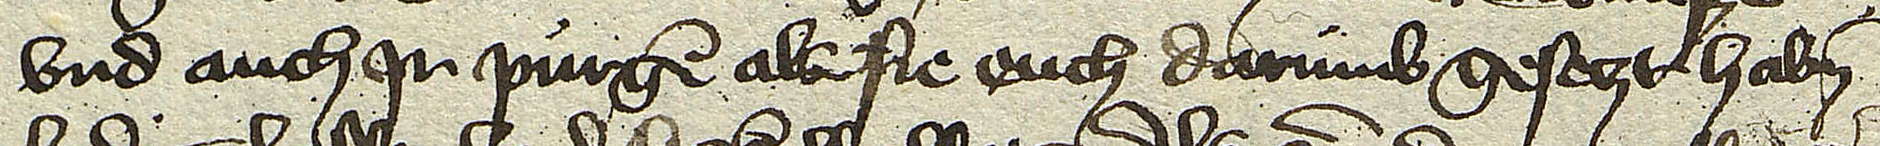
vnd auch Ir pürge* als ſie euch darümb geſecʒt habn*
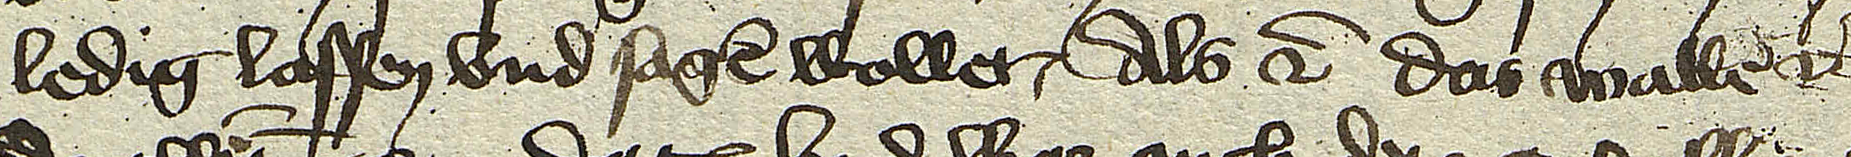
ledig laſſen vnd ſage* wollet / Als ec* das wolle*
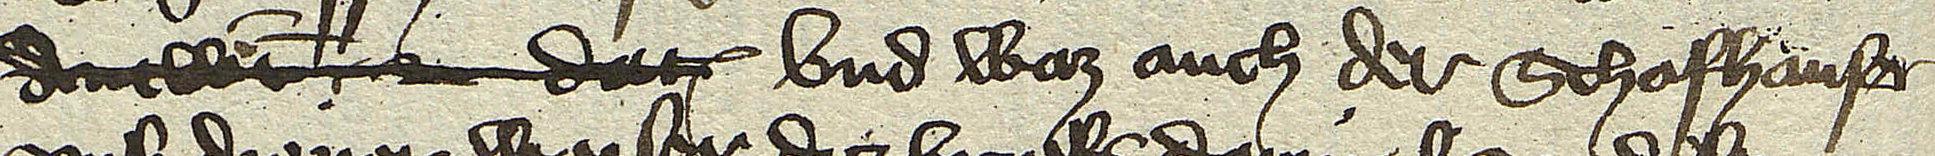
Antwt* / ec* dat* vnd waʒ auch der Schofhauſer
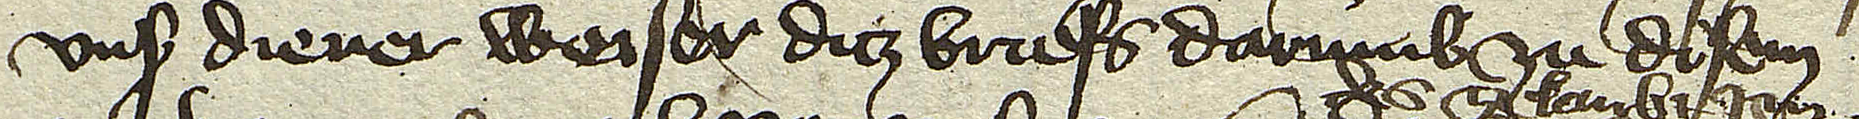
vnſ* diener weiſer dicʒ briefs darümb cʒu diſem
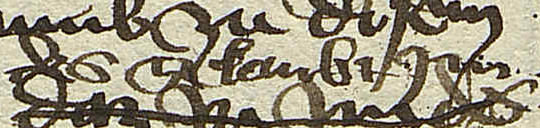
des gelaubt Im
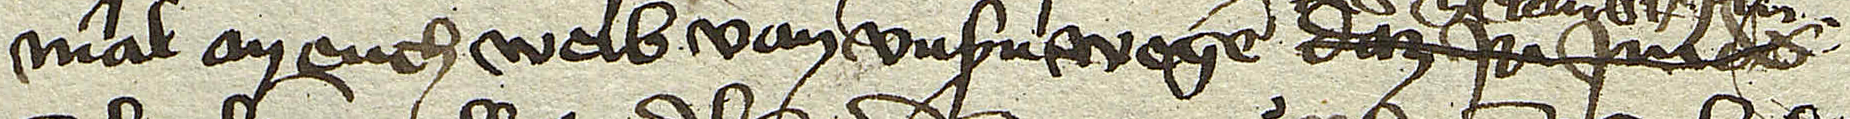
mal an euch weis von vnſ*n wege* daʒ Ir Im des
